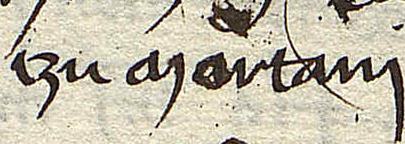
cʒu Mortani
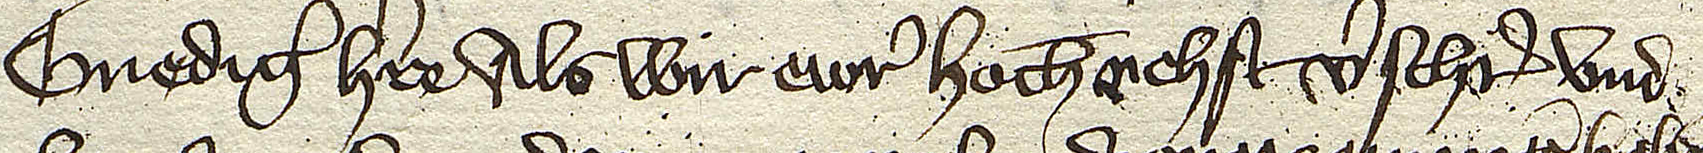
Gnedig* h*re Als wir ew*r hoch* nehſt v*ſchr* vnd
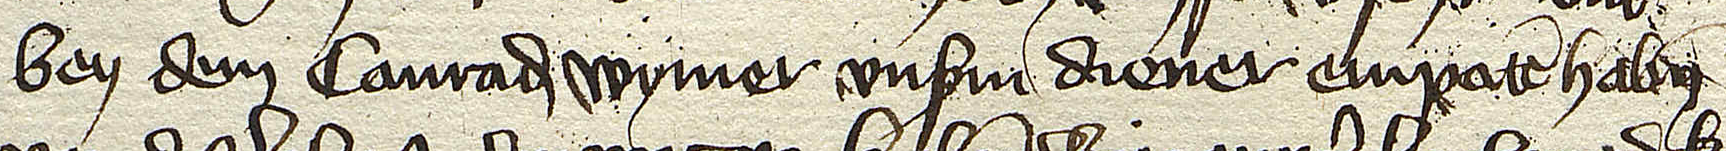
bey dem Conrad* Wymer vnſ*m diener empote* hab*n
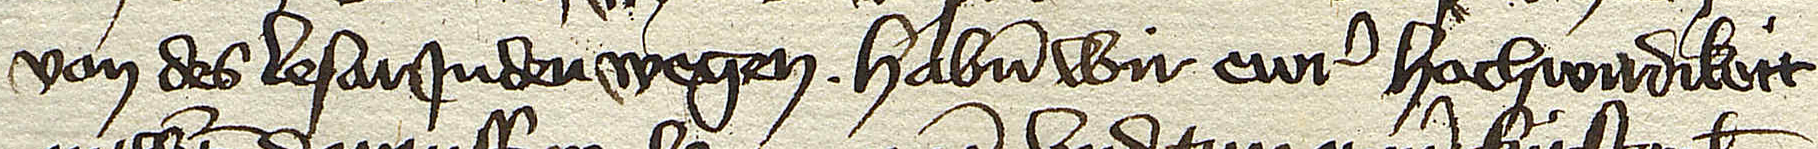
von des leſar Iuden wegen . hab*n wir ew*r hochwirdikeit
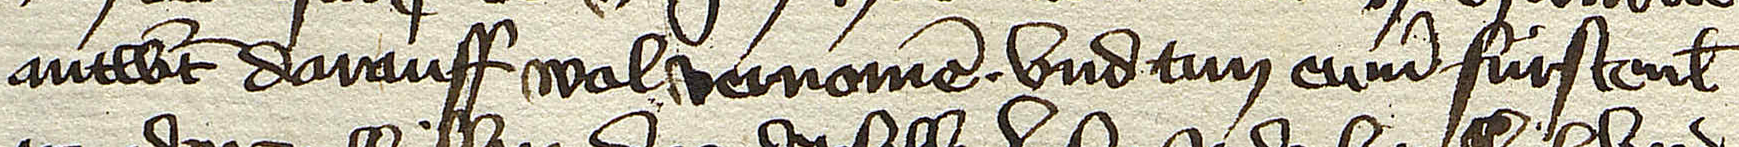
antw*t darauff wol vernome* . vnd tun ew*n fürſtenl*
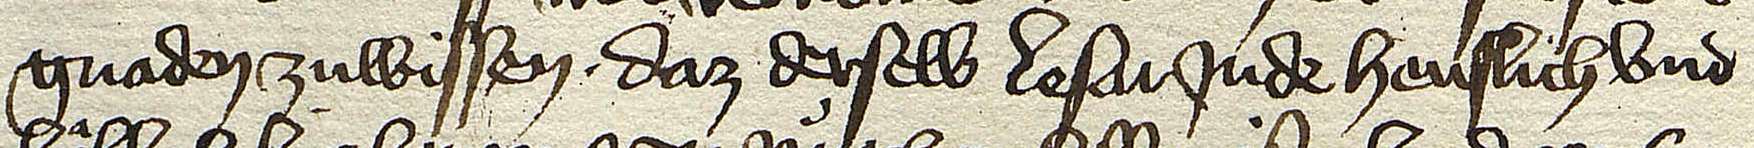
gnaden ʒuwiſſen . daʒ derſelb leſar Iude heuſlich vnd
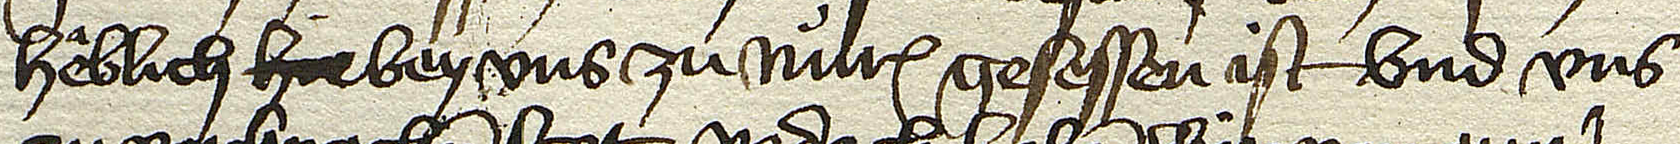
hëblich hie bey vns ʒu Nür* geſeſſen iſt vnd vns
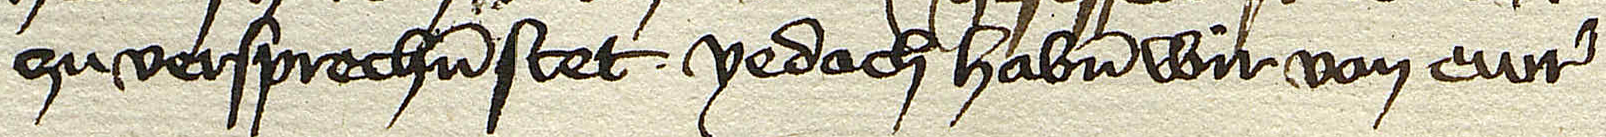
cʒu verſprech*n ſtet . yedoch hab*n wir von ew*r
